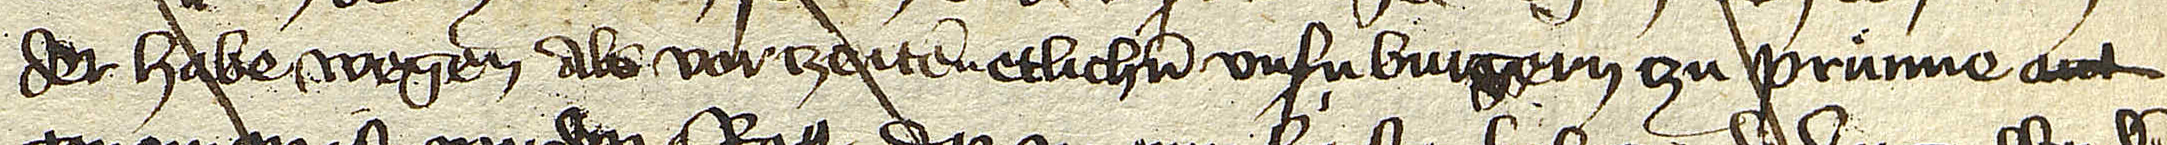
der habe wegen Als vor cʒeiten ~ etlichn* vnſ*n burgern cʒu Prünne ant
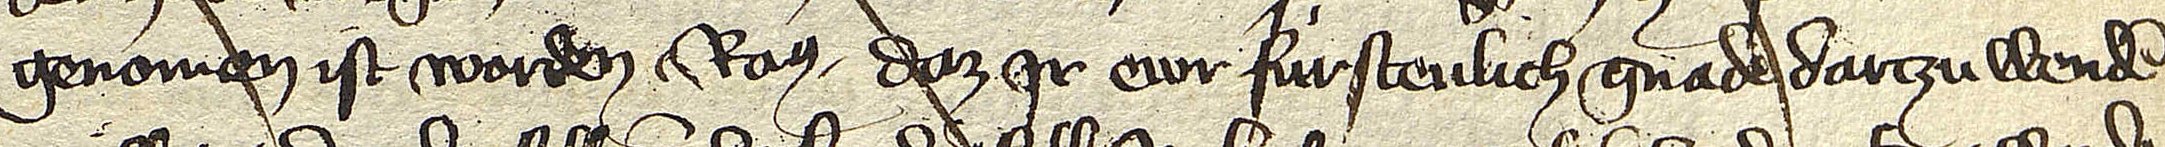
genomen iſt worden / Ro* / daʒ Ir ewr fürſtenlich gnade darcʒu wend*
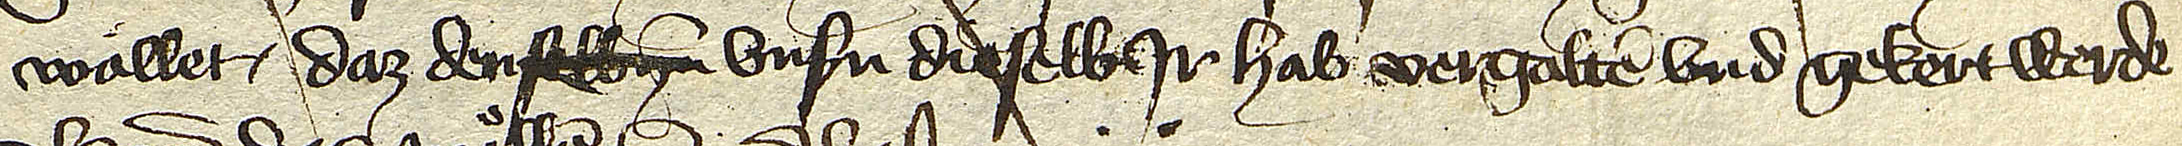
wöllet / daʒ denſelben ~ vnſ*n dieſelb Ir hab vergolte* vnd gekert werde
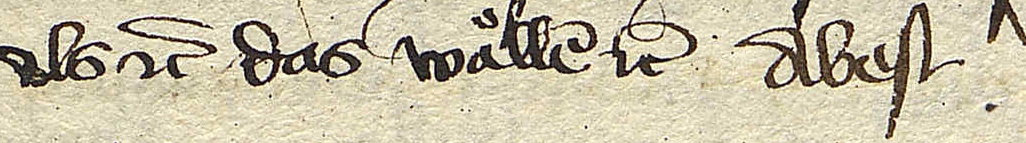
Als ec* das wölle* ec* Abeſt
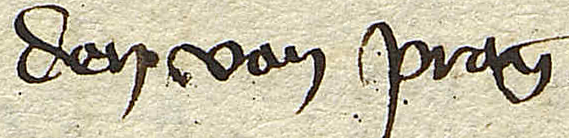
den von Prag
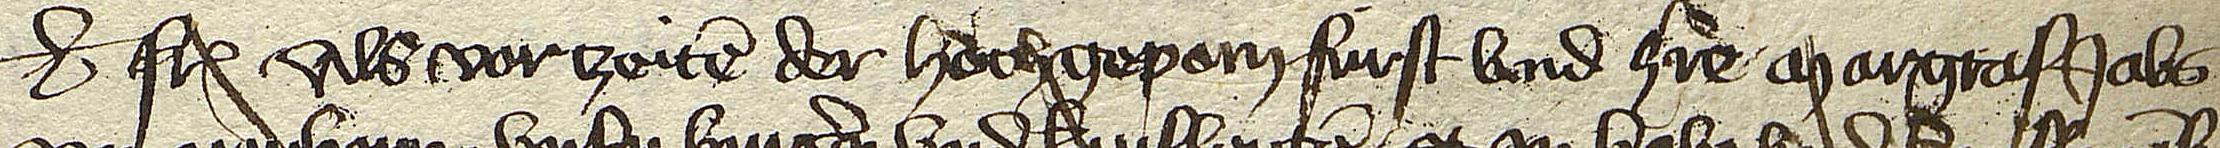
L* fr* / Als vorcʒeite* der hochgeporn fürſt vnd h*re Margraf Iobs
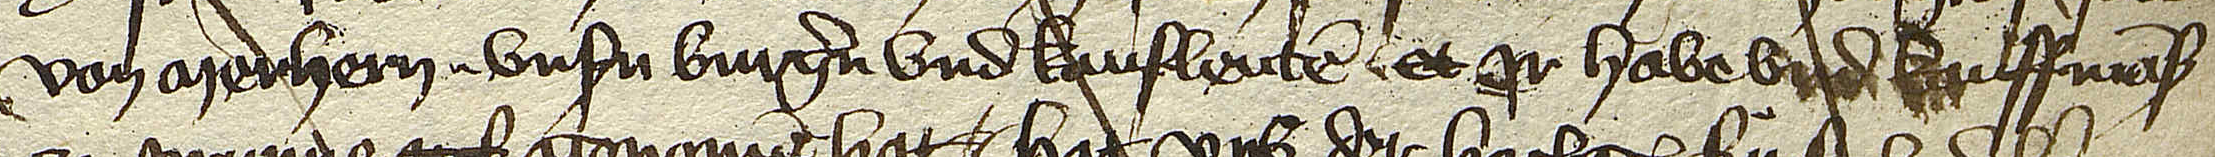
von Merhe%% ~ vnſ*n burg*n vnd kaufleute* %% Ir habe vnd kauffmaſ*
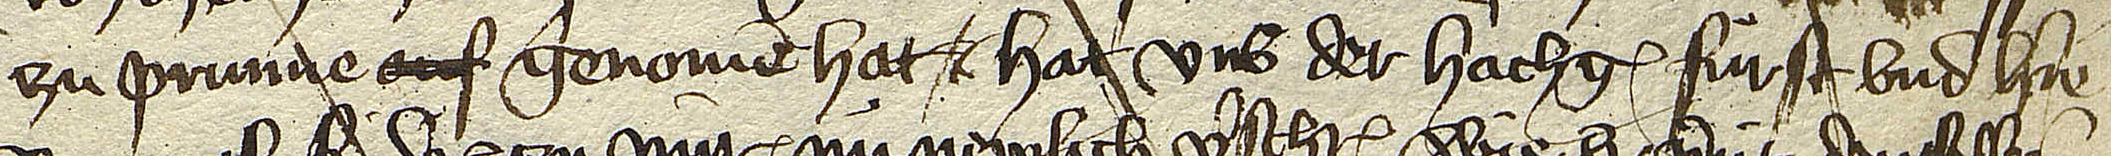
cʒu Prunne auf genome* hat / hat vns der hochg* fürſt vnd h*re
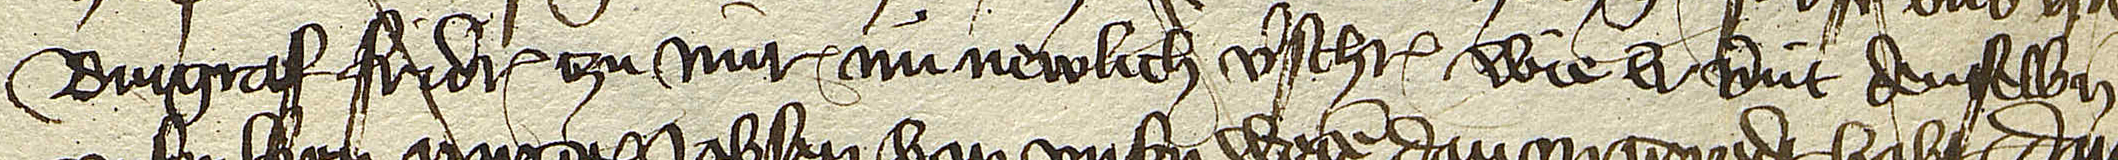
Burgraf Fridr* cʒu Nür nü newlich v*ſchr* / wie Er mit demſelbn*
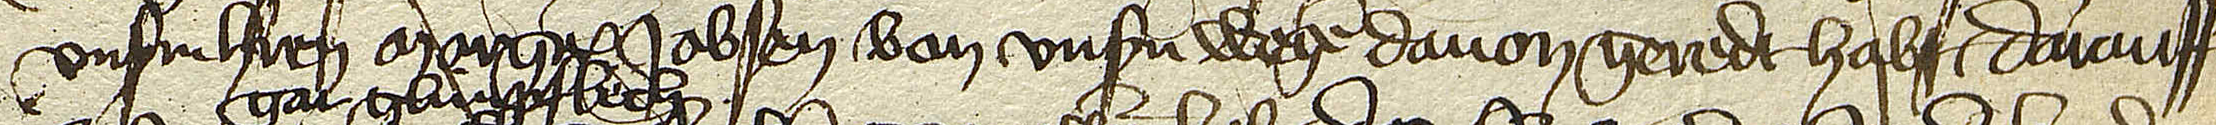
vnſ*m h*ren Margraf* Iobſen / von vnſ*n wege* dauon geredt habt / darauff
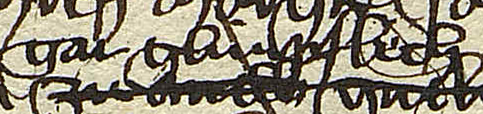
gar glimpflich
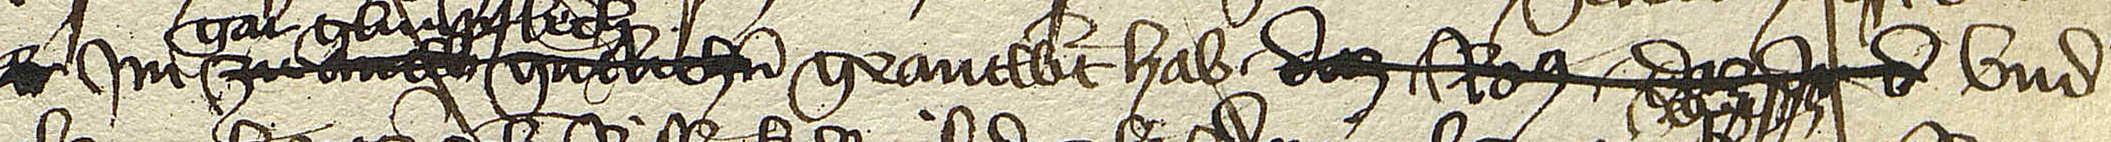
Er Im cʒu antw gutlichn* geantwt* hab / daʒ Ro* / daʒ Ir d vnd
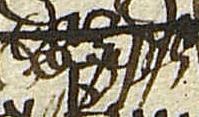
%%%%%%
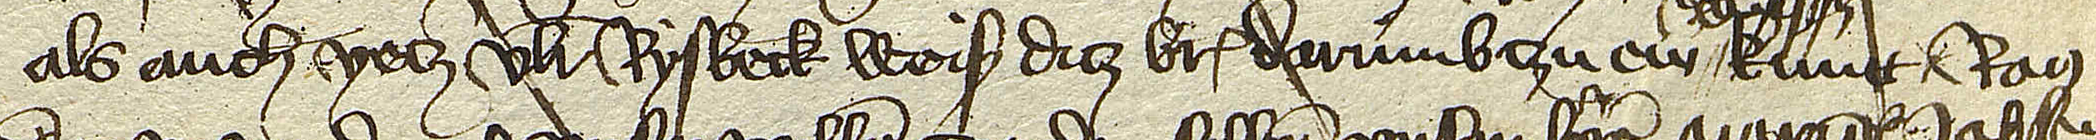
als auch yecʒ* vlr* Ryſbeck weiſ* dicʒ br* darümb cʒu ew kümt / Ro*
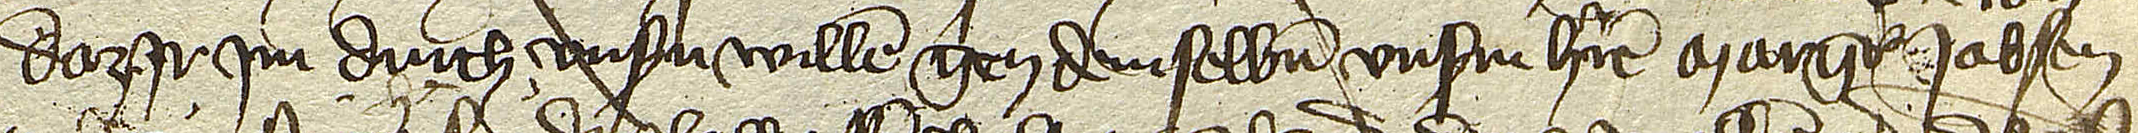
daʒ Ir Im durch vnſ*n wille* gen demſelbn* vnſ*m hre* Margr* Iobſen
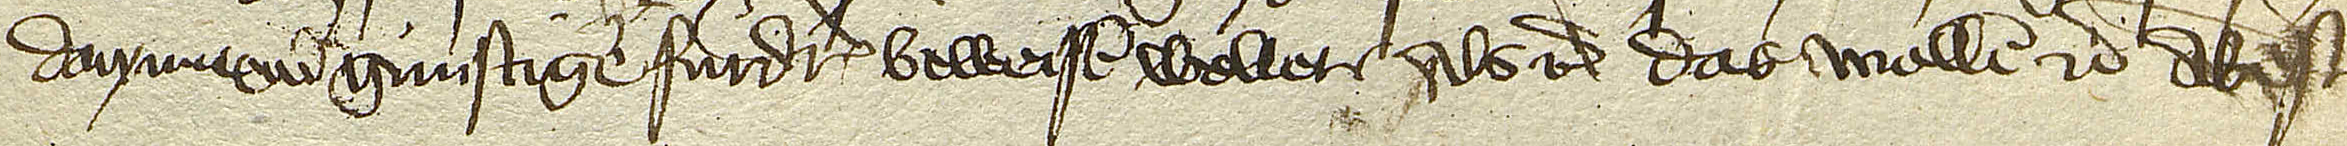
darynne ew* günſtige fürdr* beweiſe* wollet / Als ec* das wolle* ec* Abeſt
